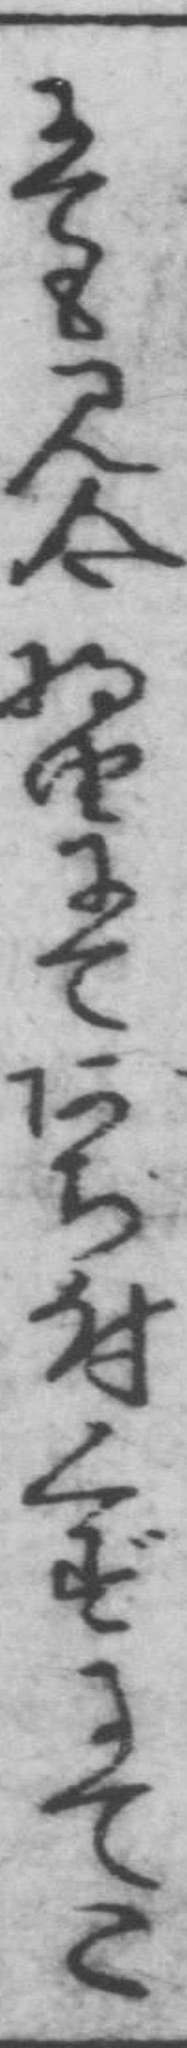にても見合にてあち付くずにてこ
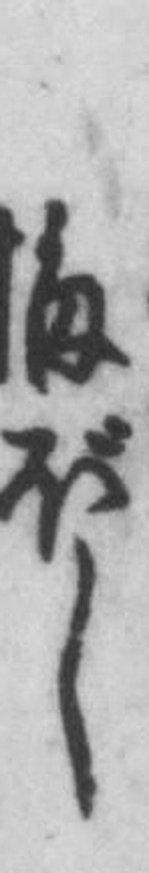梅ぼし
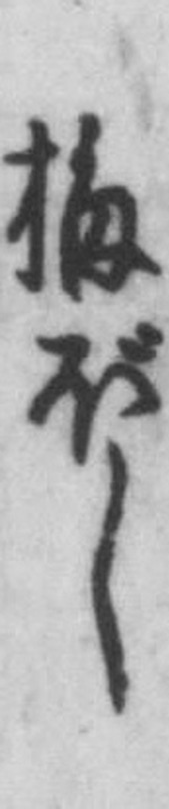梅ぼし
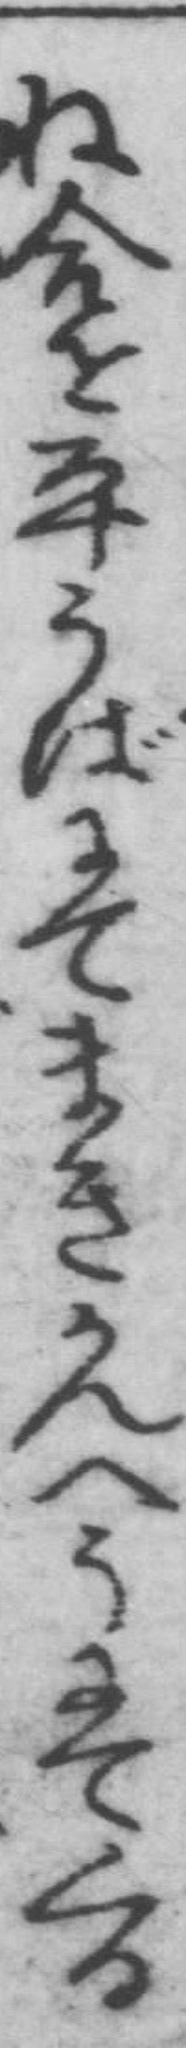ね合を平うばにてまきけんへうにてくる
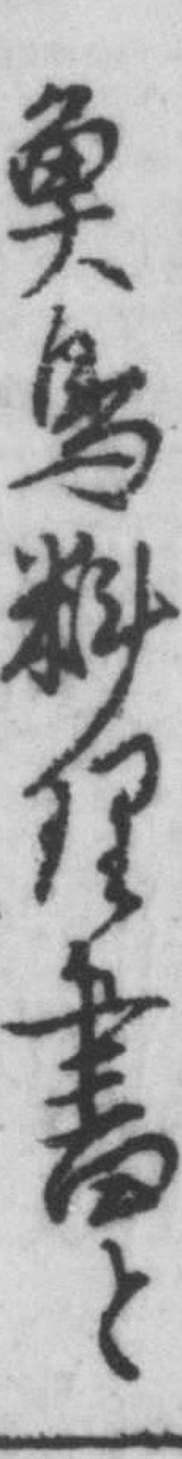魚鳥料理書と
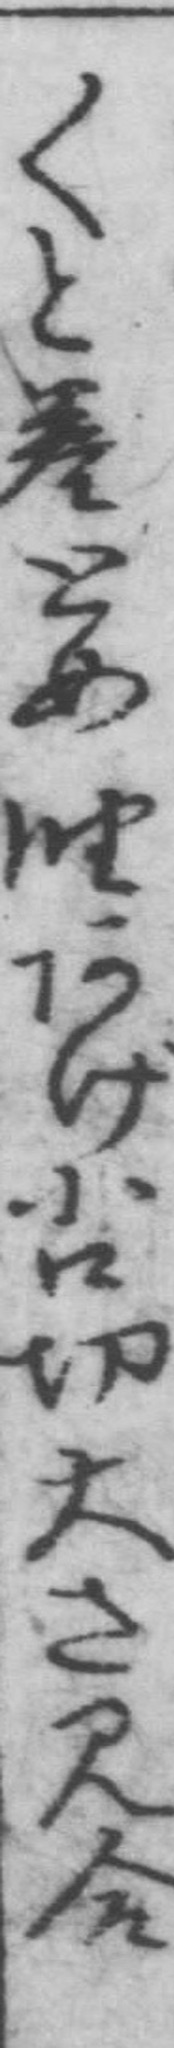〳〵と巻とめ油あげ小口切大さ見合
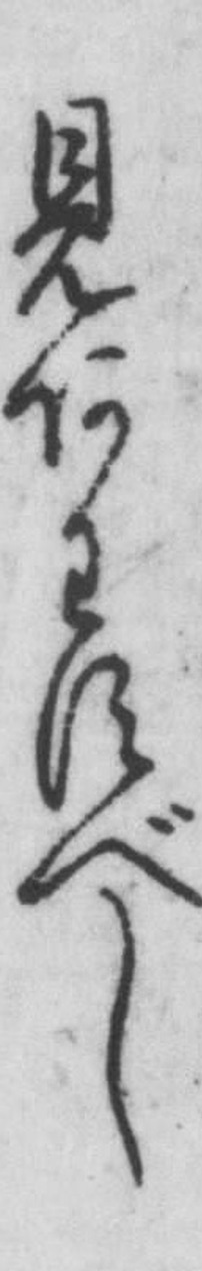見あわすべし
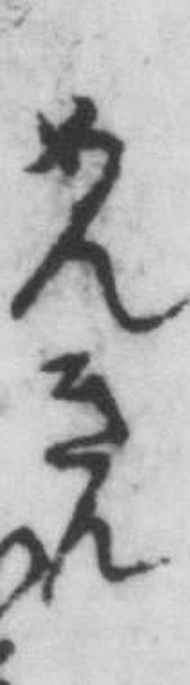めんきん
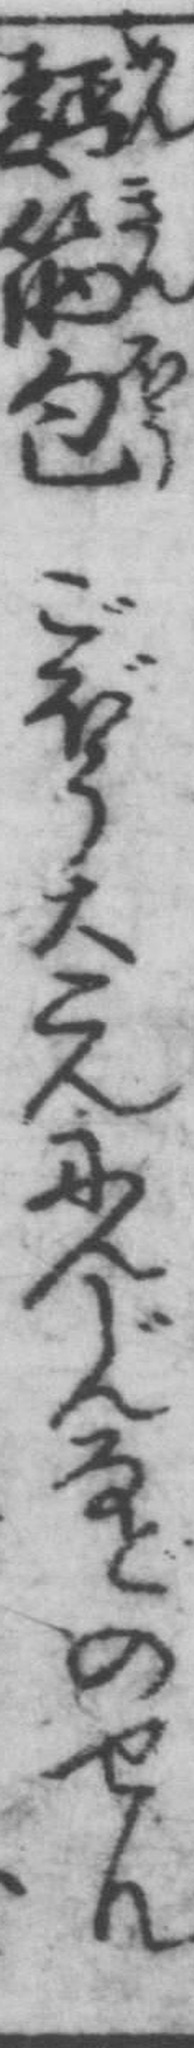麺筋包ごぼう大こんにんじんなとのせん
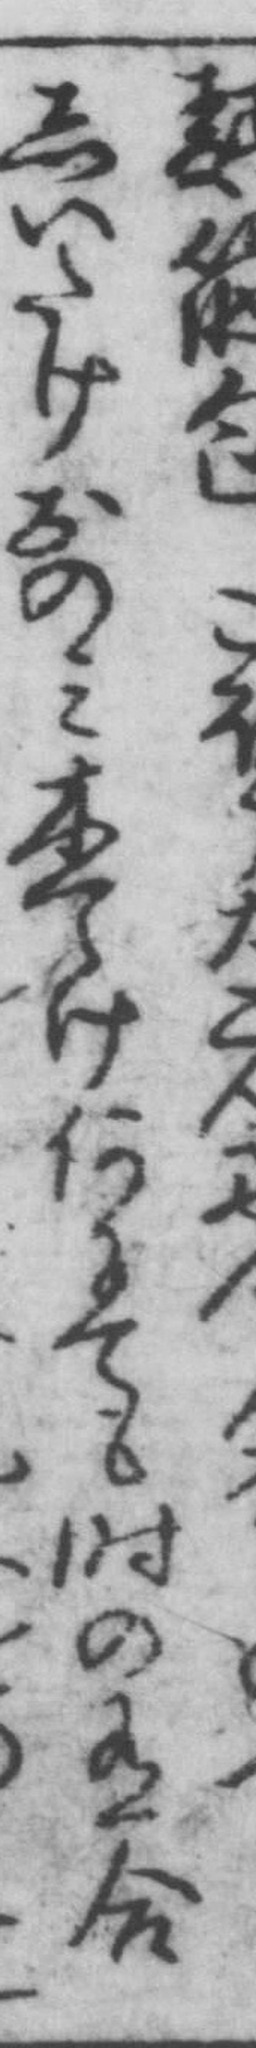しいたけのミ木くらげ何しても時の有合
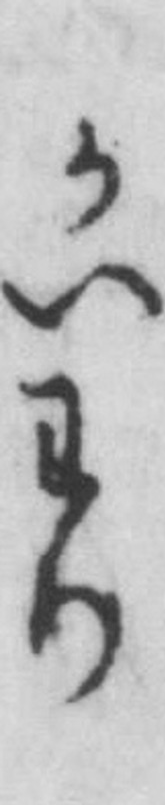かいわり
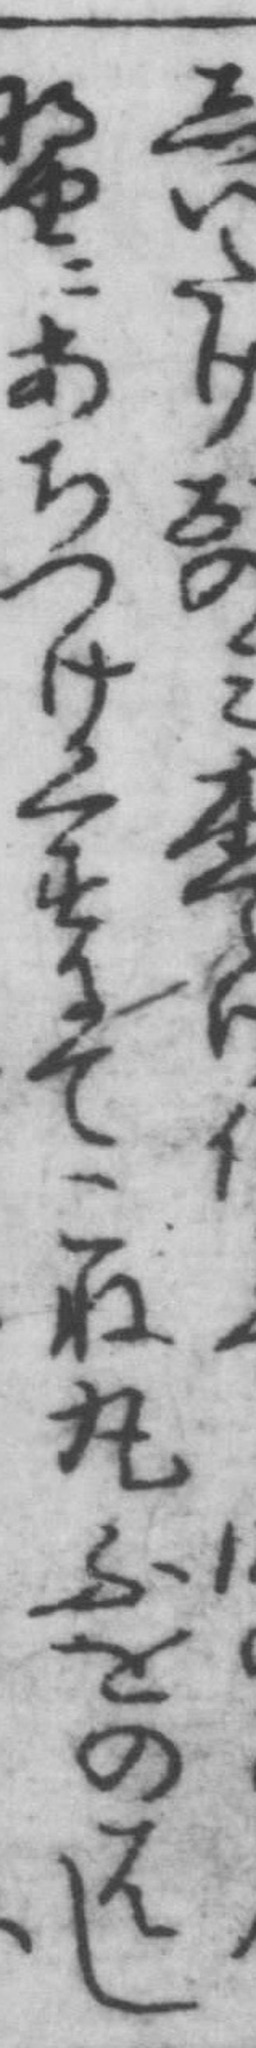にあちつけくすにてこね丸ふをのはし
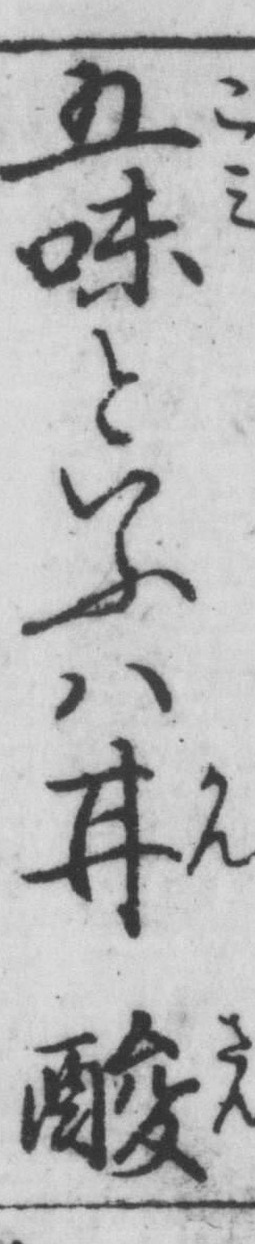五味といふハ甘酸
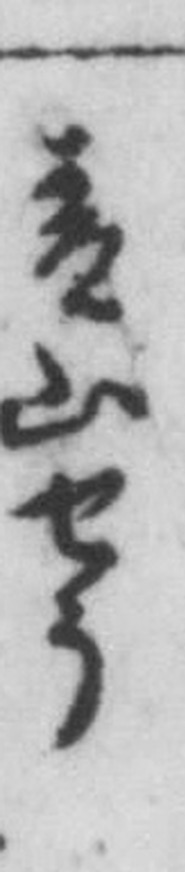青山せう
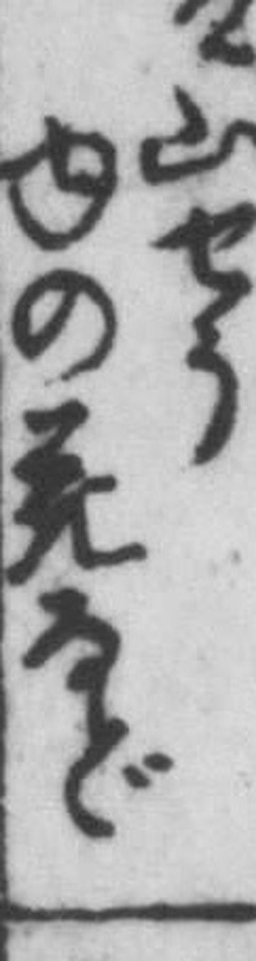ゆの花など
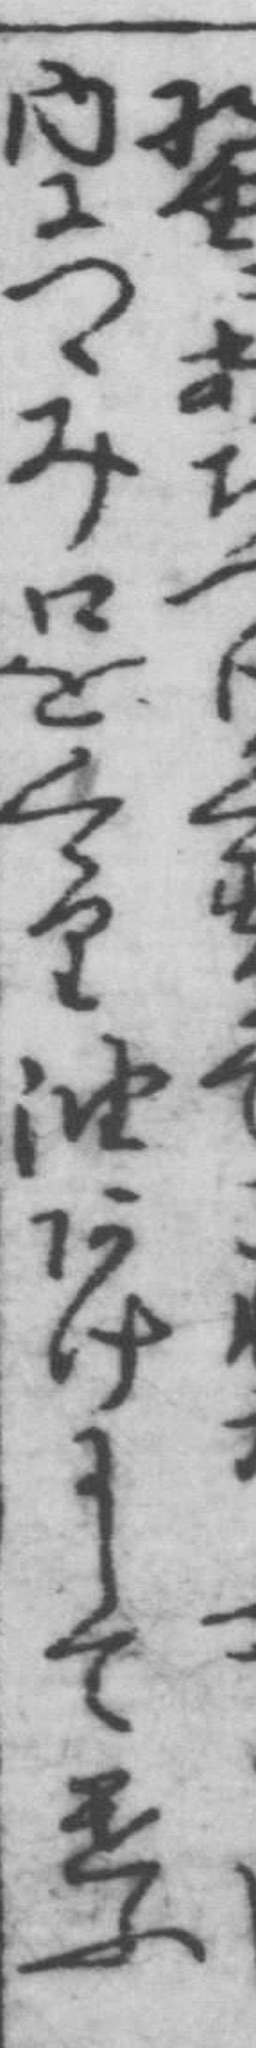内につゝみ口をくゝる油あけにして遣ふ
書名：料理献立抄
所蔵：大阪府立大学学術情報センター 国文学研究資料館
